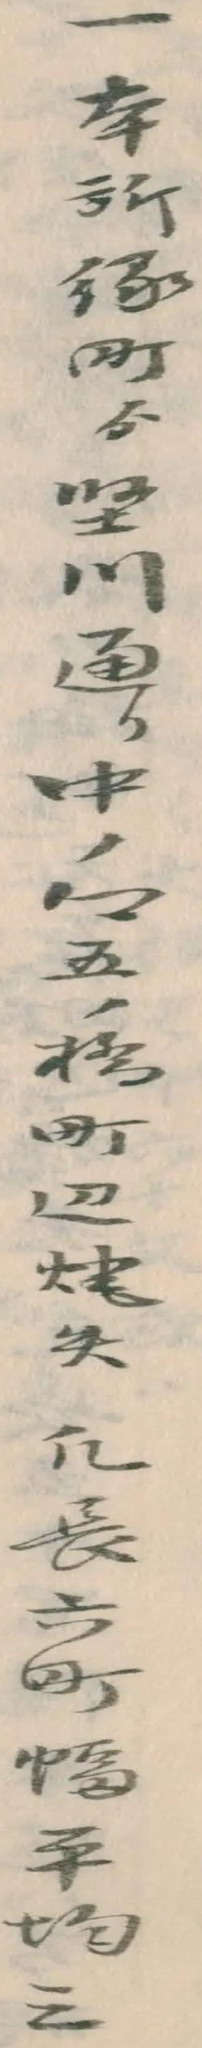一本所縁町ゟ堅川通り中ノ郷五ノ橋町辺焼失凡長六町幅平均三
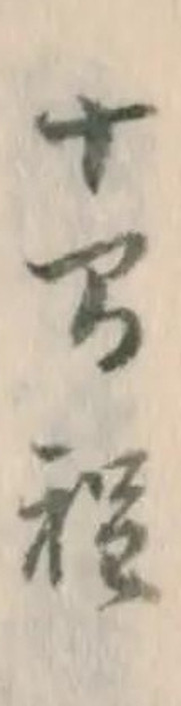十間程
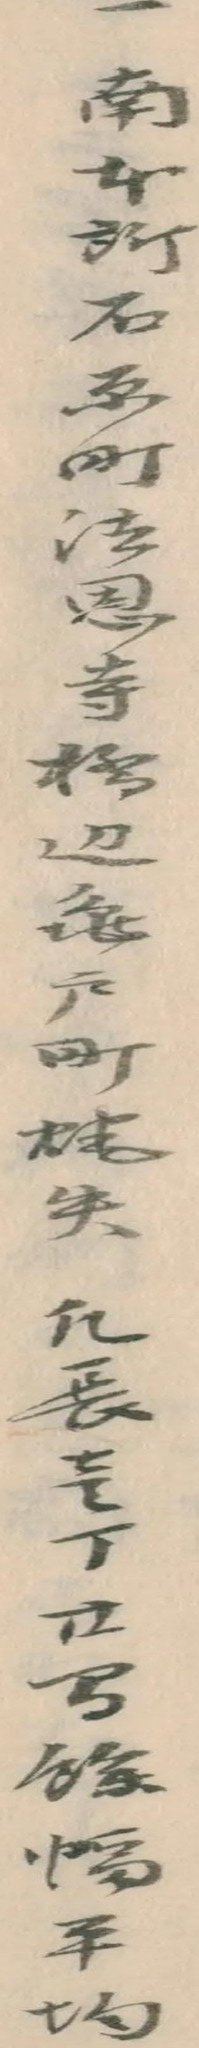一南本所石原町法恩寺橋辺亀戸町焼失凡長壱丁廿間余幅平均

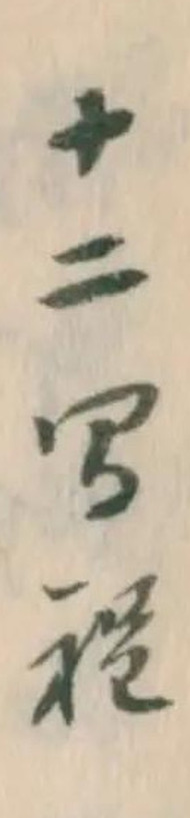十二間程
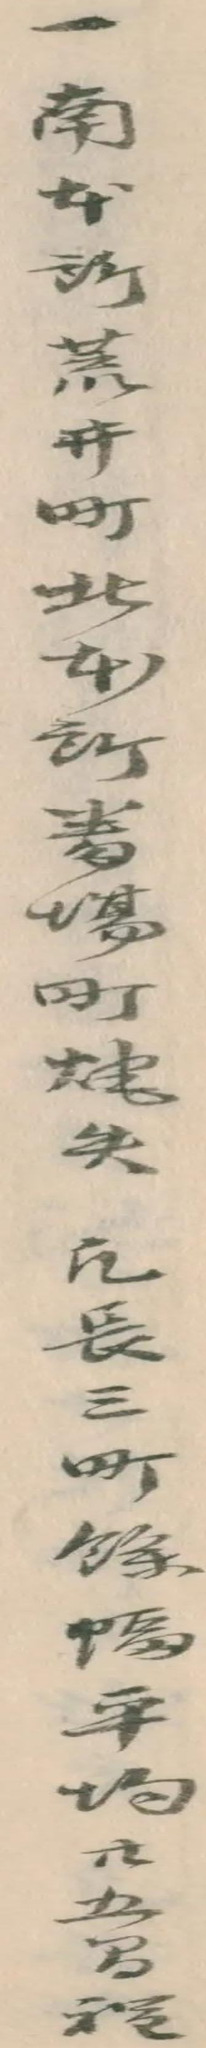一南本所荒井町北本所番場町焼失凡長三町余幅平均廿五間程
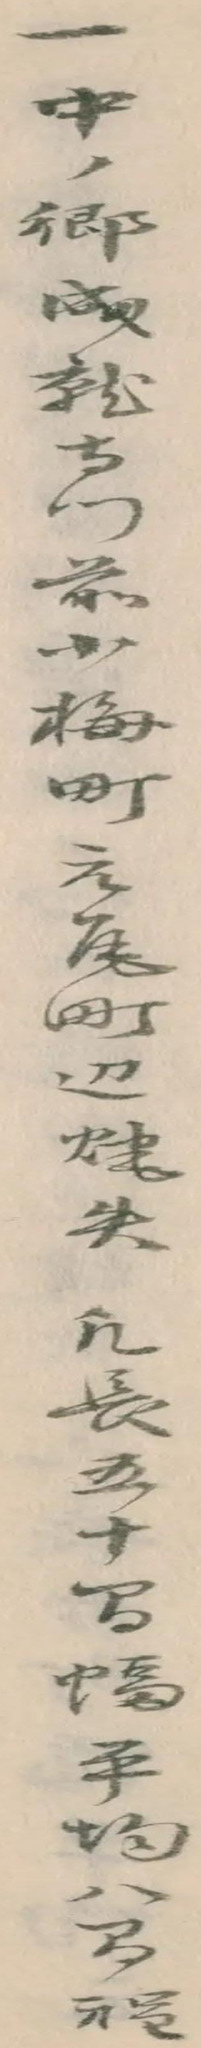一中ノ郷成就寺門前小梅町元瓦町辺焼失凡長五十間幅平均八間程
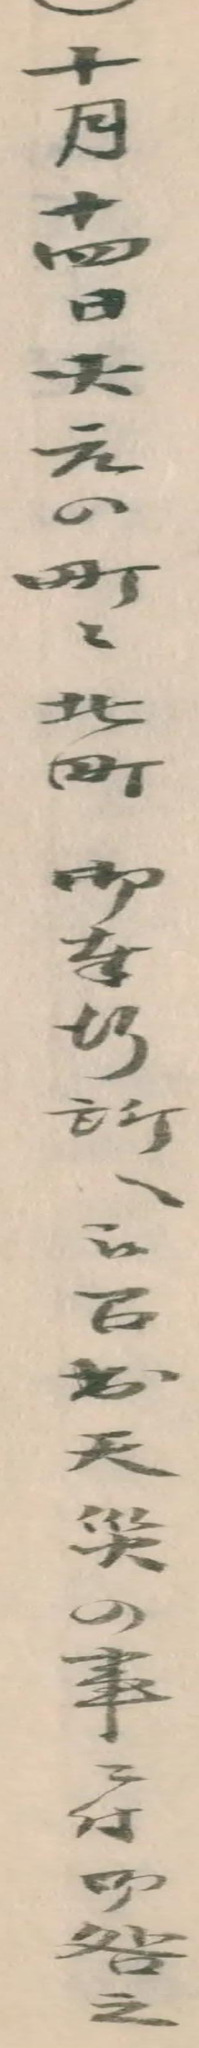〇十月十四日火元の町々北町御奉行所へ御召出天災の事に付御咎之
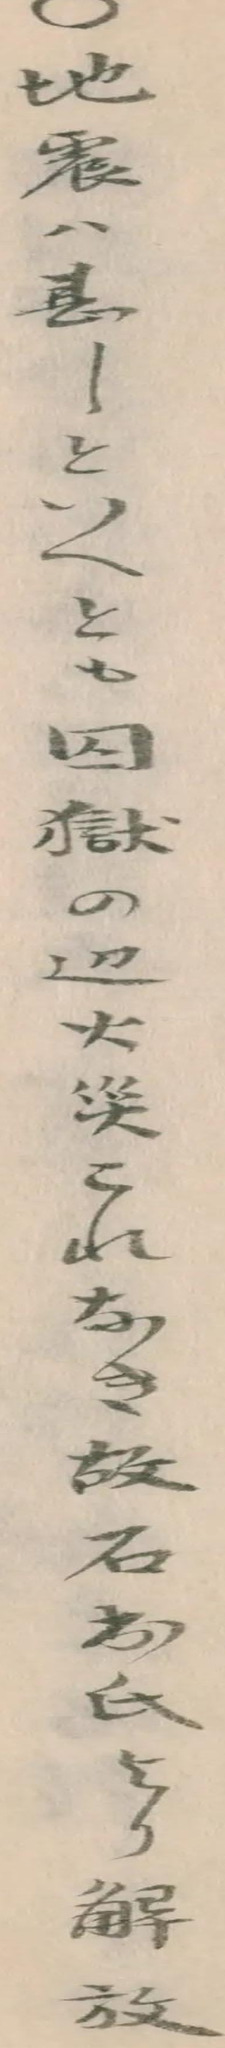〇地震は甚しといへとも囚獄の辺火災これなき故石出氏より開放
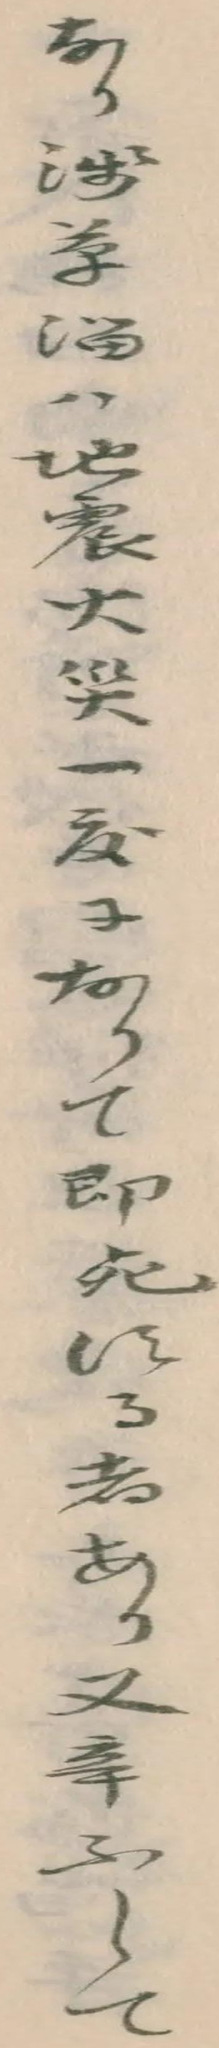なり浅草溜は地震火災一度になりて即死する者あり又辛ふして
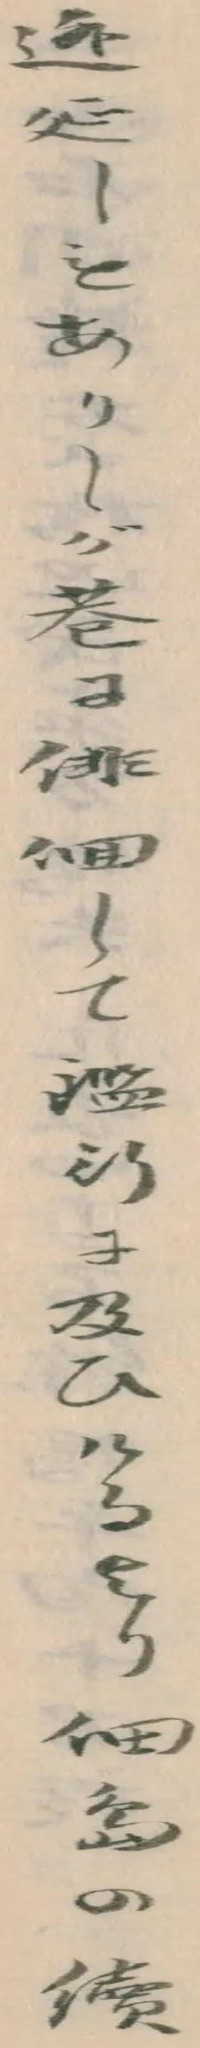逃延しもありしが巷に徘徊して鑑行に及ひけるより佃島の続
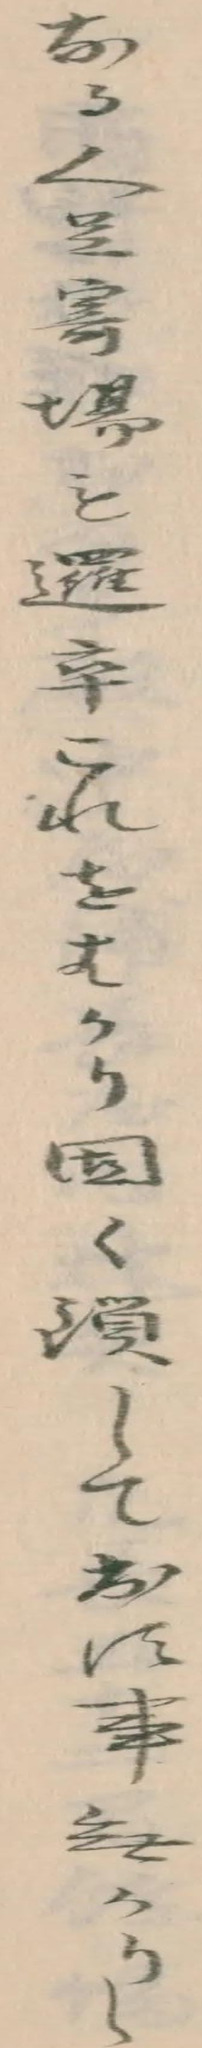なる人足寄場も邏卒これをはかり固く鎖して出す事無かりし
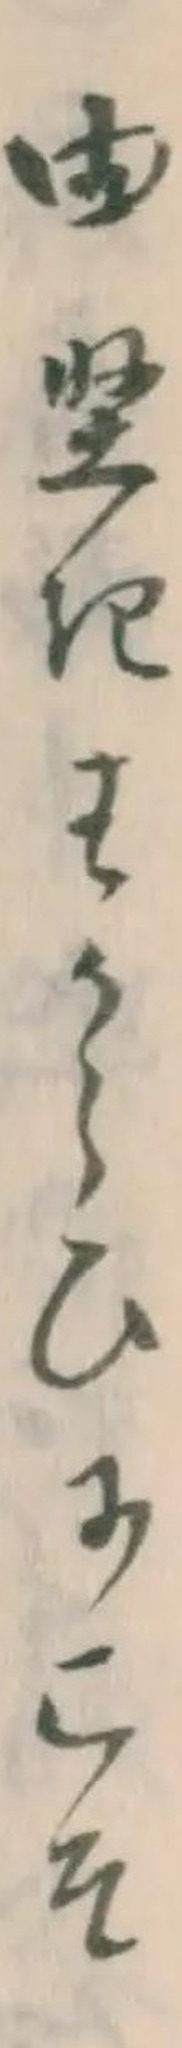由堅きはからひにこそ
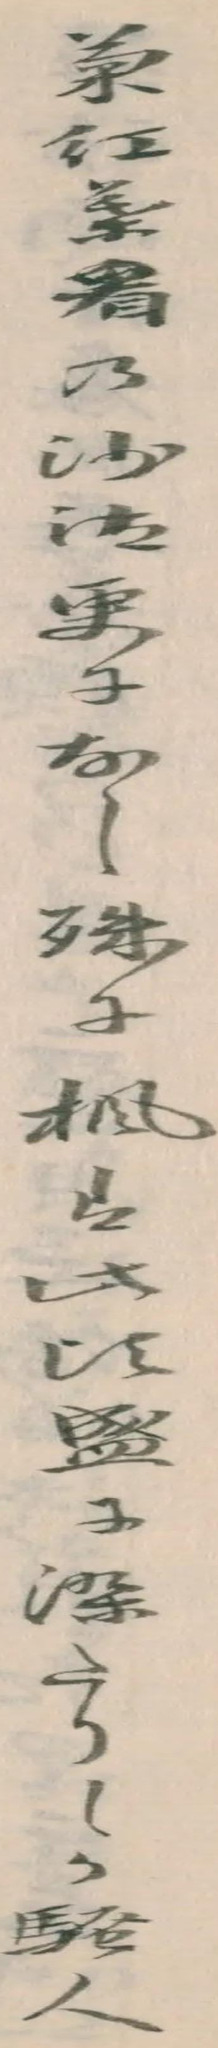菊紅葉看の沙汰更になし殊に楓は此頃盛に染たりしか騒人
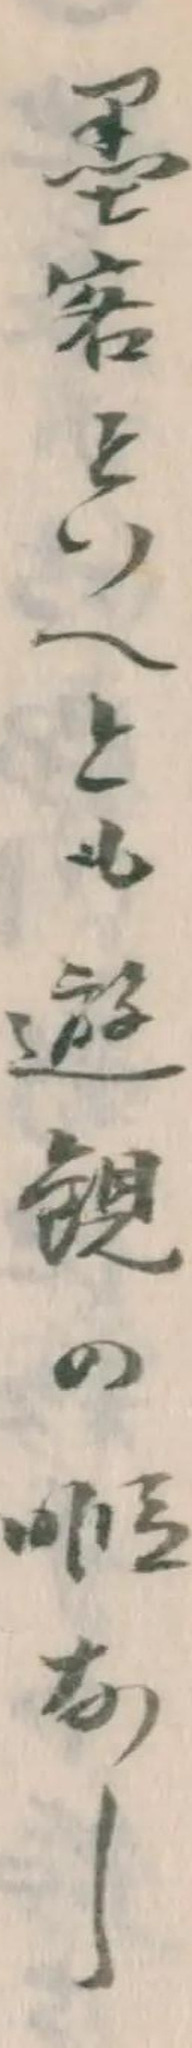墨客といへとも遊観の暇なし
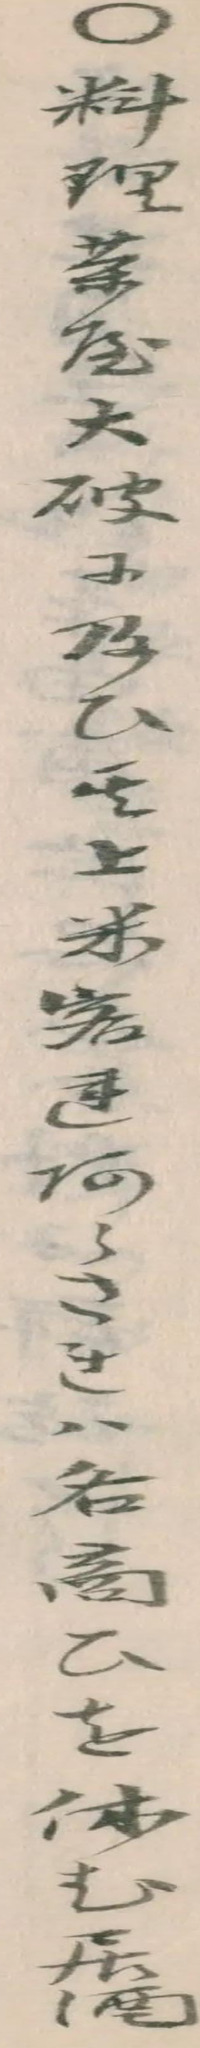〇料理茶屋大破に及ひ其上米客連あらされは各商ひを休む居酒
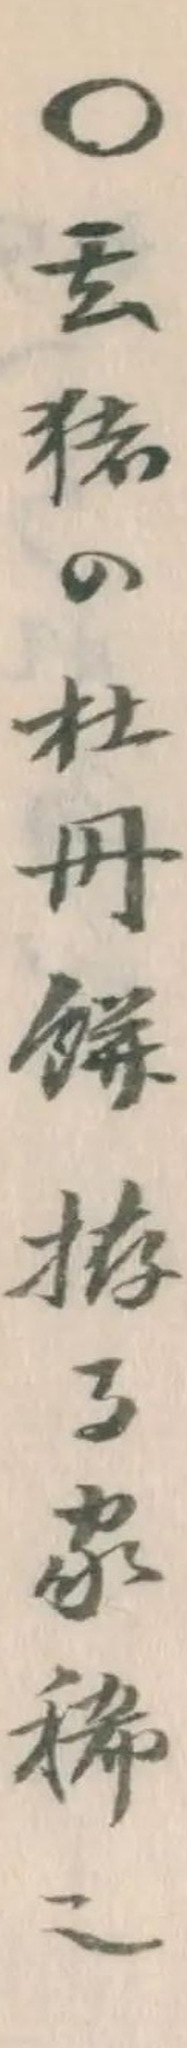〇玄猪の牡丹餅拵る家稀也
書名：地災撮要. 巻7-9(地震之部)
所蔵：国立国会図書館 National Diet Library, JAPAN
